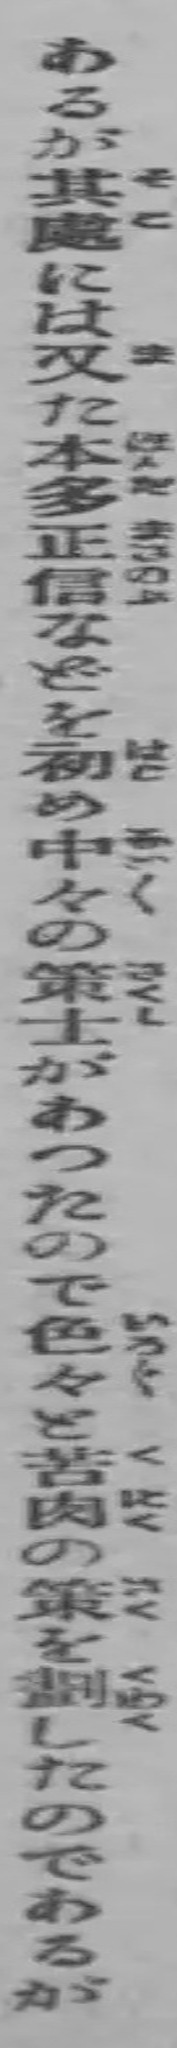あるが其処には又た本多正信などを初め中々の策士があつたので色々と苦肉の策を割したのであるが
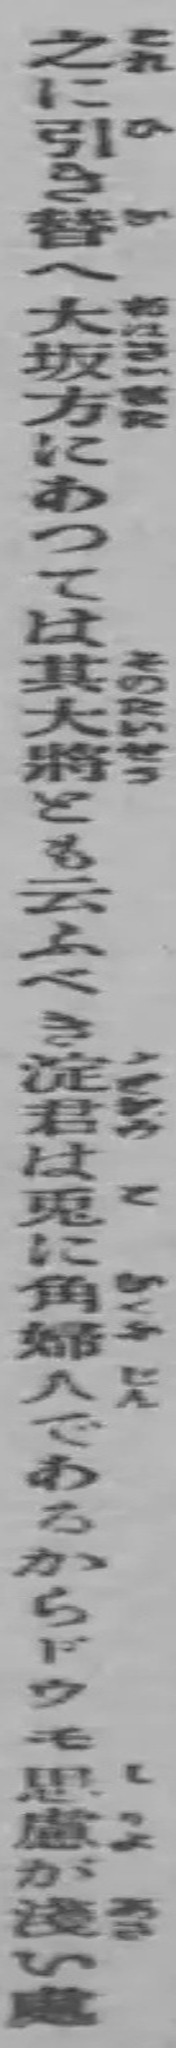之に引き替へ大坂方にあつては其大将とも云ふべき淀君は兎に角婦人であるからドウモ思慮が浅い処
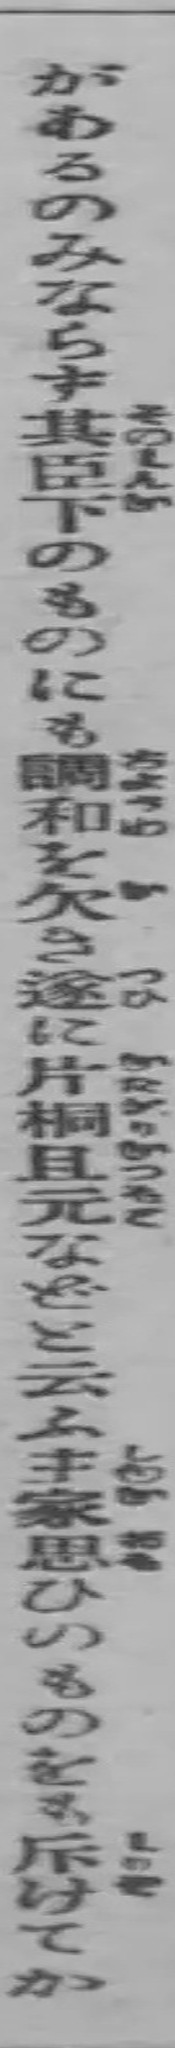大坂冬の役があるのみならず其臣下のものにも調和を欠き遂に片桐且元などと云ふ主家思ひのものをも斥けてか
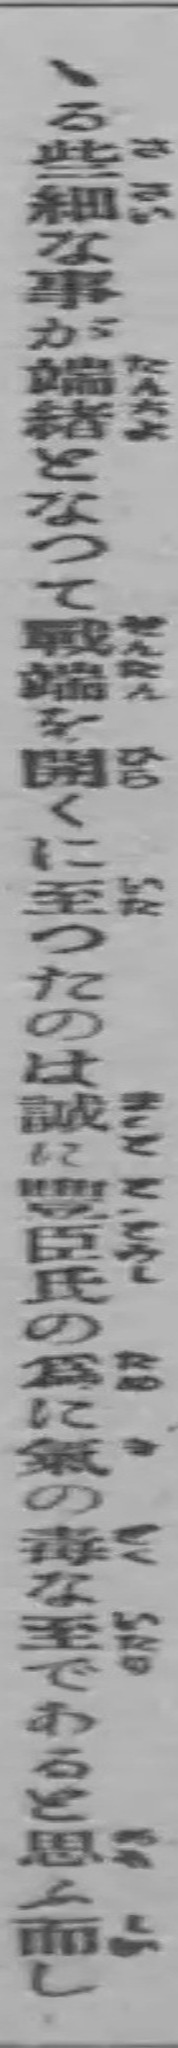ゝる些細な事が端緒となつて戦端を開くに至つたのは誠に豊臣氏の為に気の毒な至であると思ふ而し
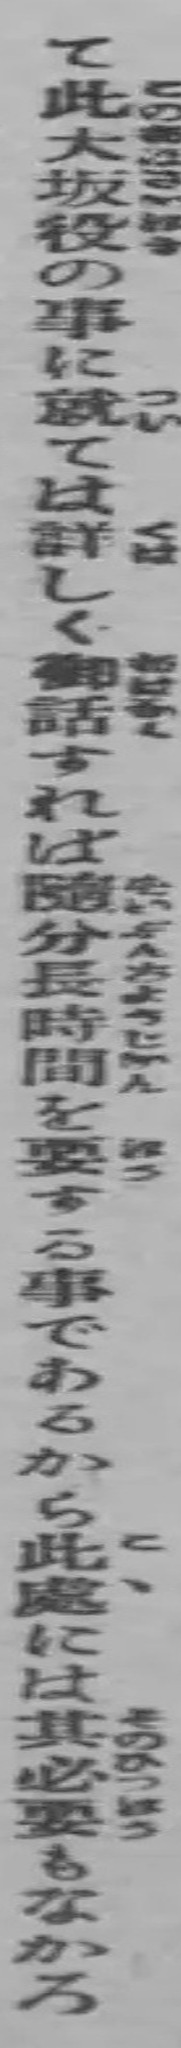て此大坂役の事に就ては詳しく御話すれば随分長時間を要する事であるから此処には其必要もなかろ
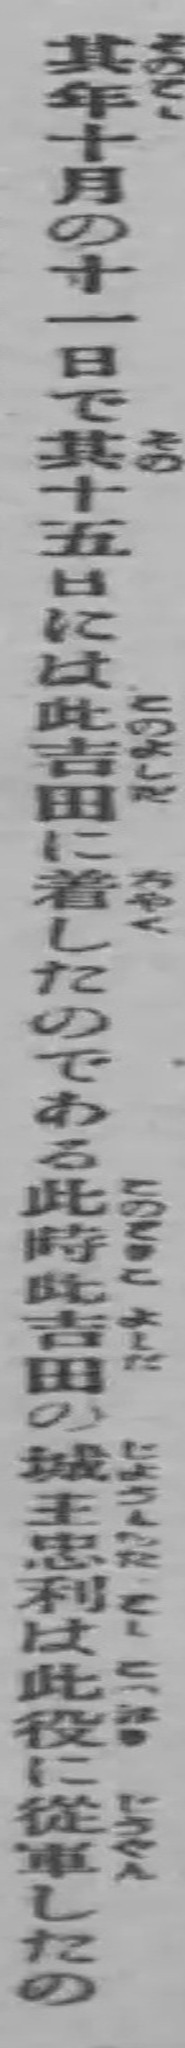田に次す其年十月の十一日で其十五日には此吉田に着したのである此時此吉田の城主忠利は此役に従軍したの
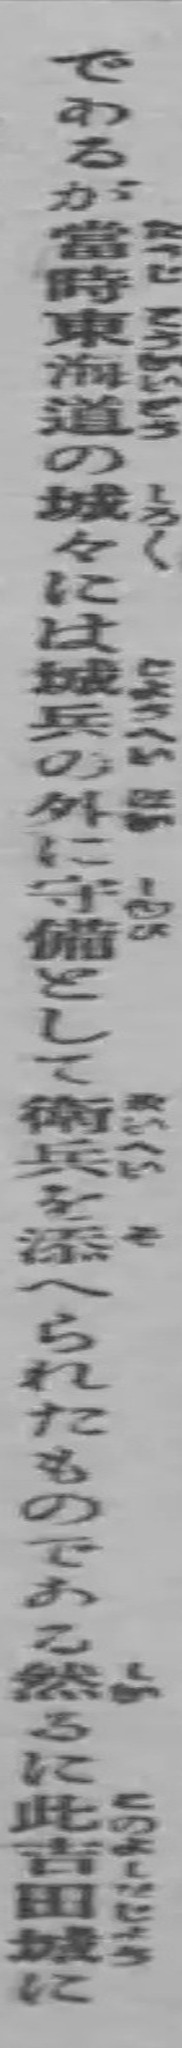であるが当時東海道の城々には城兵の外に守備として衛兵を添へられたものである然るに此吉田城に
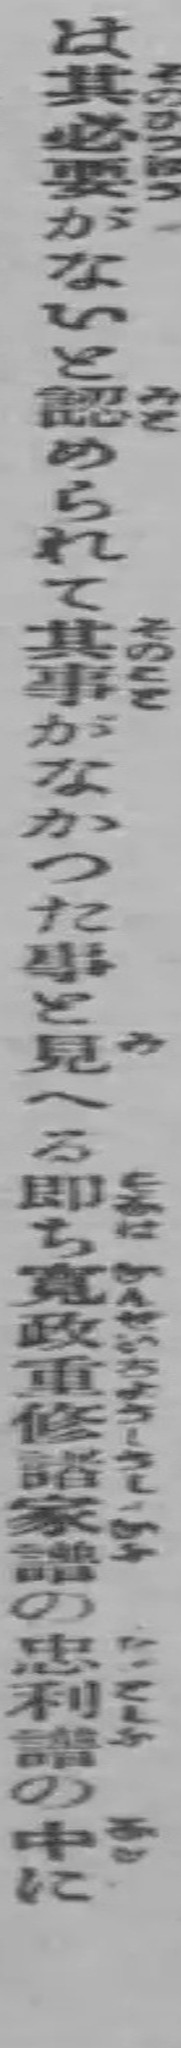は其必要がないと認められて其こ事がなかつた事と見へる即ち寛政重修諸家譜の忠利譜の中に
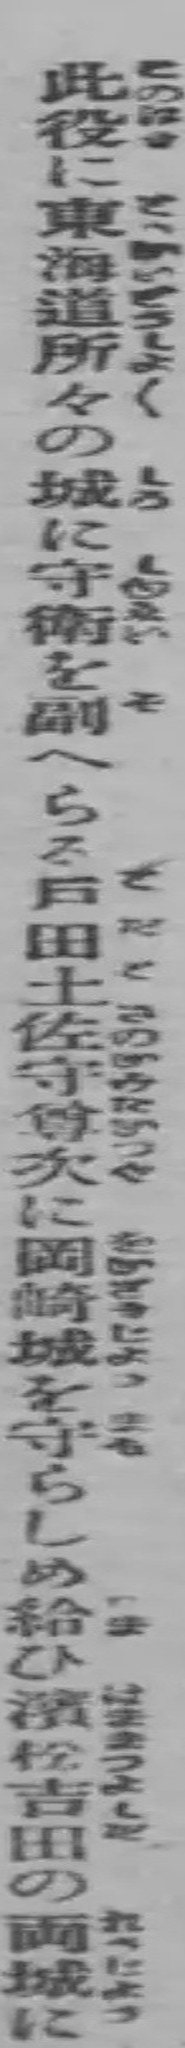此役に東海道所々の城に守衛を副へらる戸田土佐守尊次に岡崎城を守らしめ給ひ浜松吉田の両城に
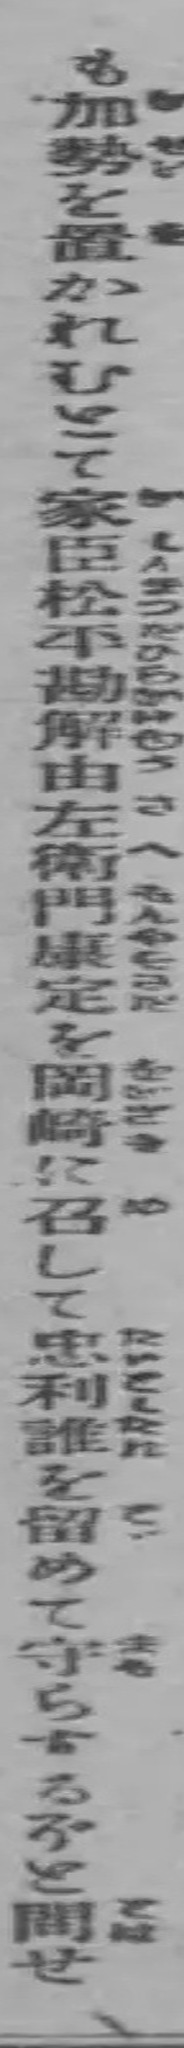も加勢を置かれむとて家臣松平勘解由左衛門康定を岡崎に召して忠利誰を留めて守らするぞと問せ

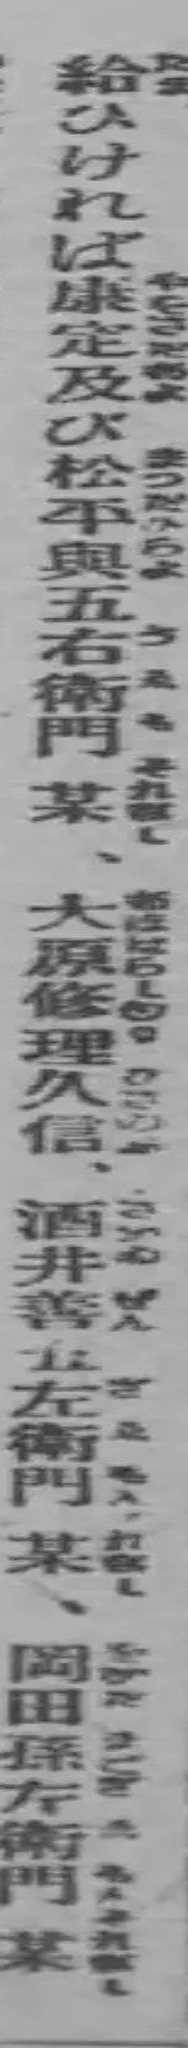給ひければ康定及び松平与五右衛門某、大原修理久信、酒井善五左衛門某、岡田孫左衛門某
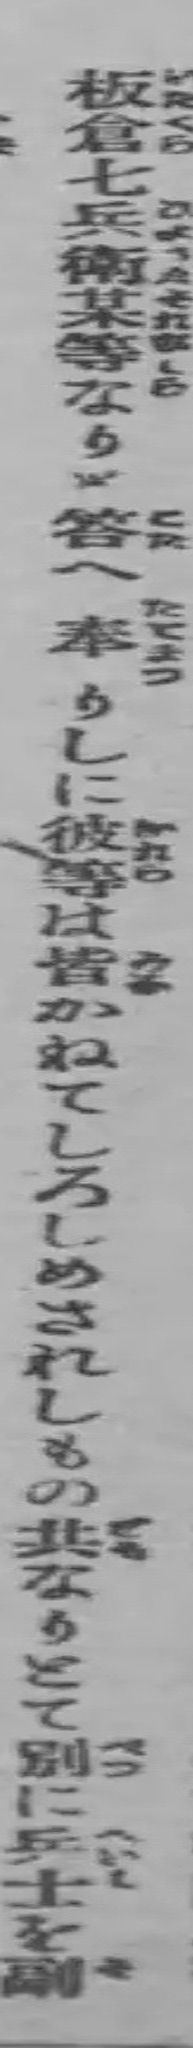板倉七兵衛某等なりと答へ奉りしに彼等は皆かねてしろしめされしもの共なりとて別に兵士を副
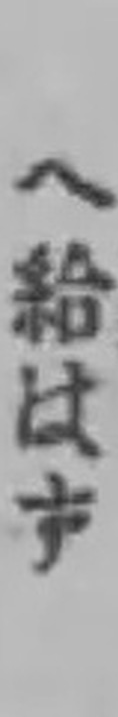へ給はず
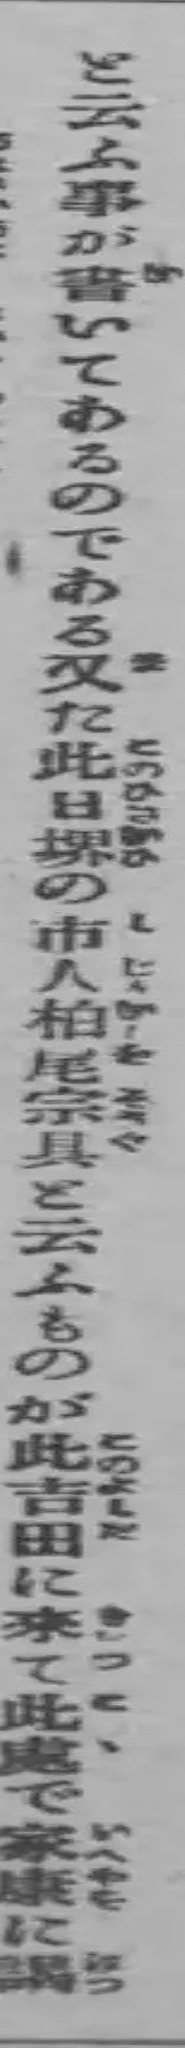と云ふ事が書いてあるのである又た此日堺の市人柏尾宗具と云ふものが此吉田に来て此処で家康に謁
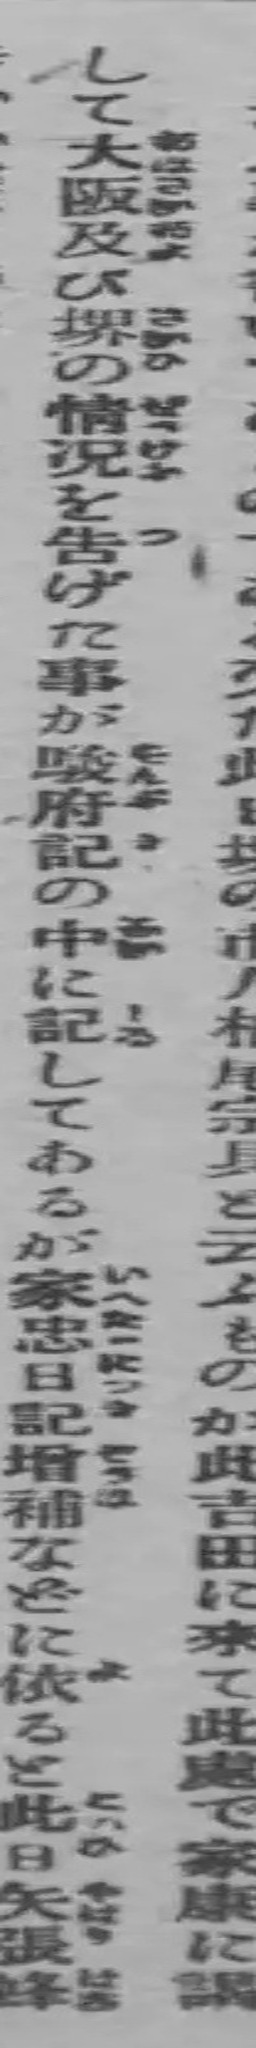して大阪及び堺の情況を告げた事が駿府記の中に記してあるが家忠日記増補などに依ると此日矢張蜂
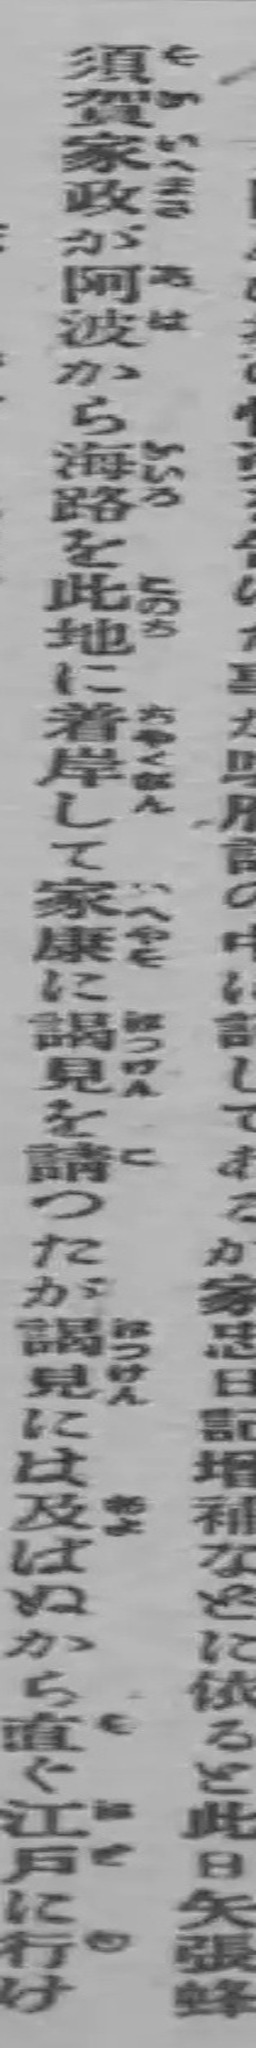須賀家政が阿波から海路を此地に着岸して家康に謁見を請つたが謁見には及ばぬから直ぐ江戸に行け
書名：豊橋市史談
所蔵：国立国会図書館 National Diet Library, JAPAN
